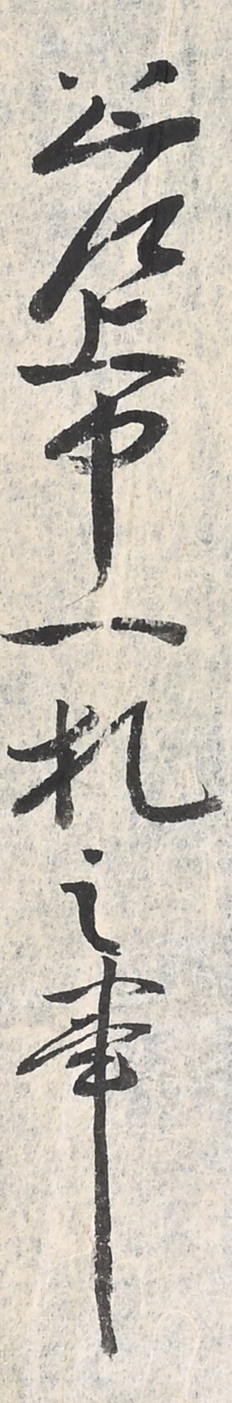差上申一札之事
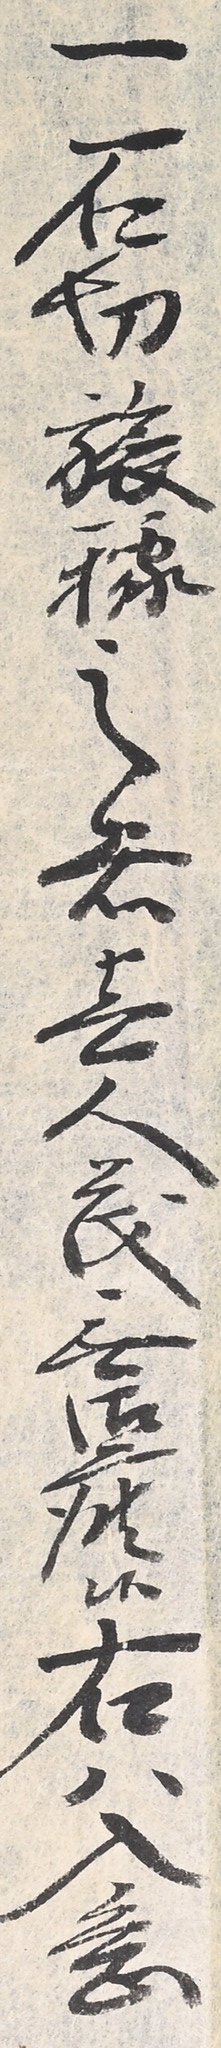一石切旅稼之者壱人も無御座候右は入念
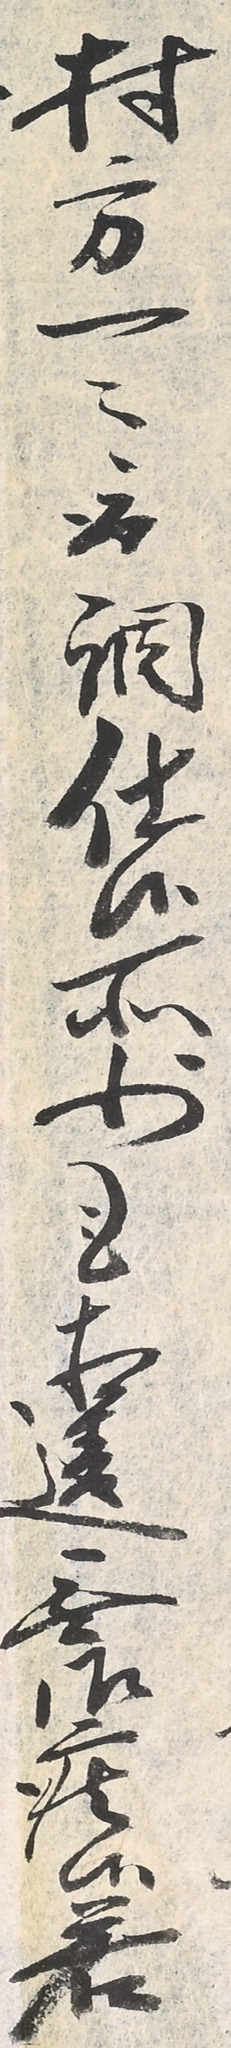村方一々取調仕候所少も相違無御座候若
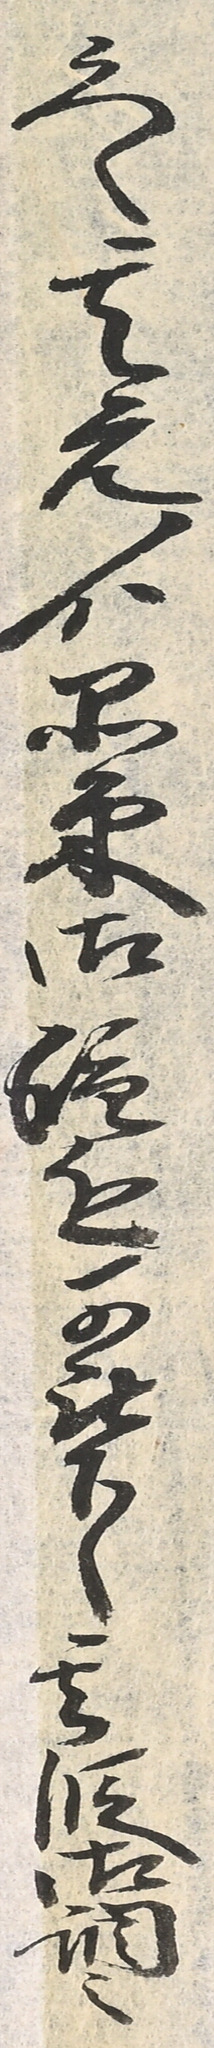候ハヽ其元ゟ品束御注進可被下候其段御調之
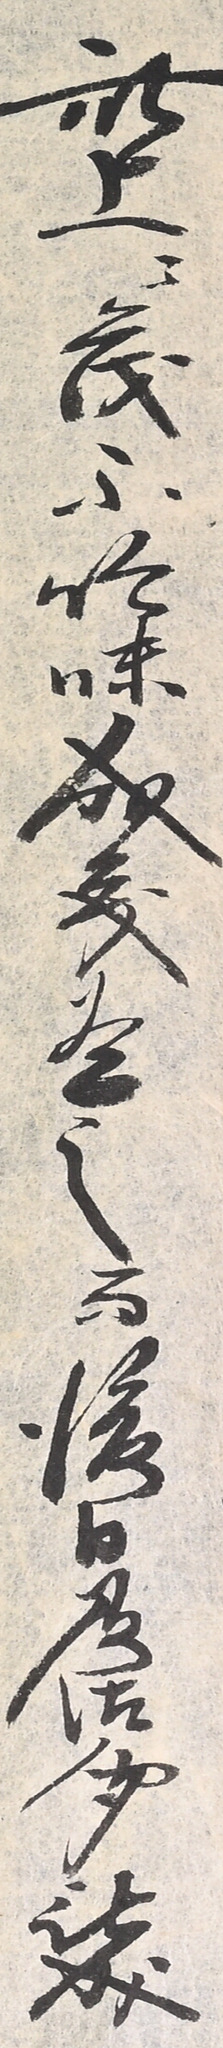此上にも不吟味成義有之て後日及御聞被成
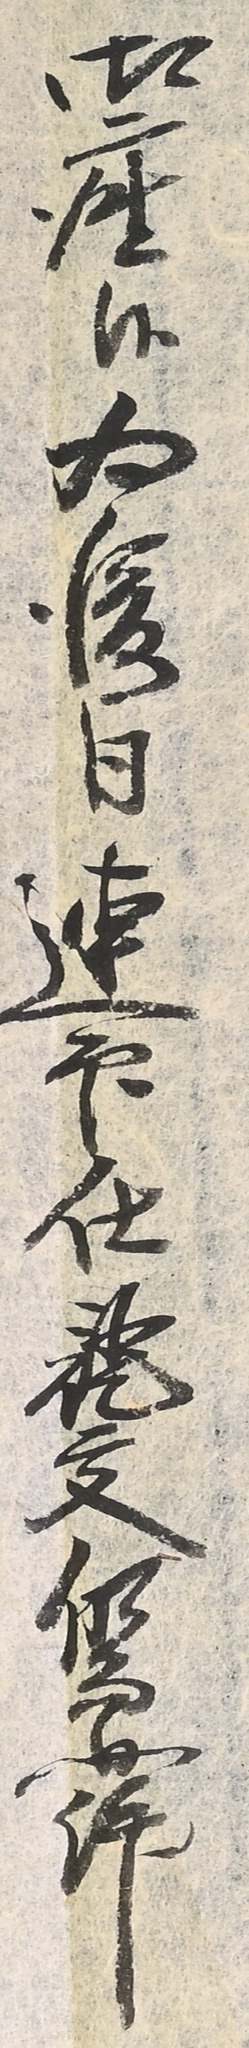御座候為後日連印仕証文仍て如件
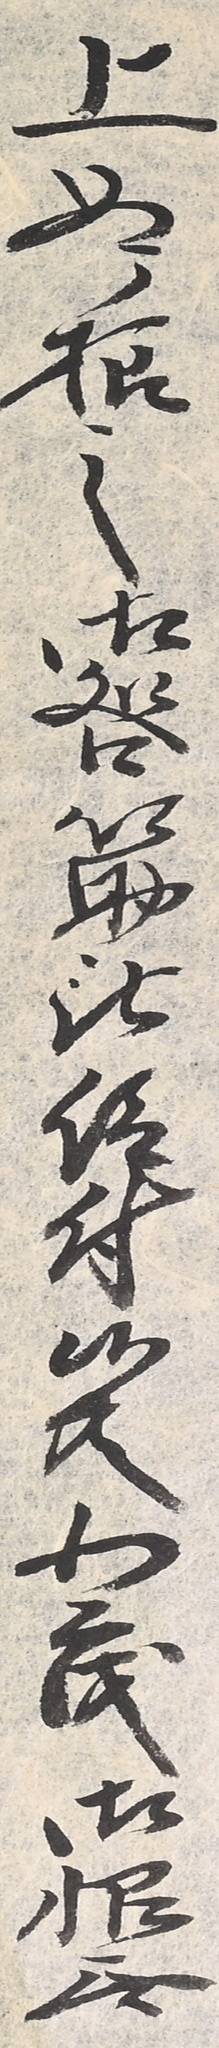上如ケ様之御咎筋被仰付候共少も御恨無
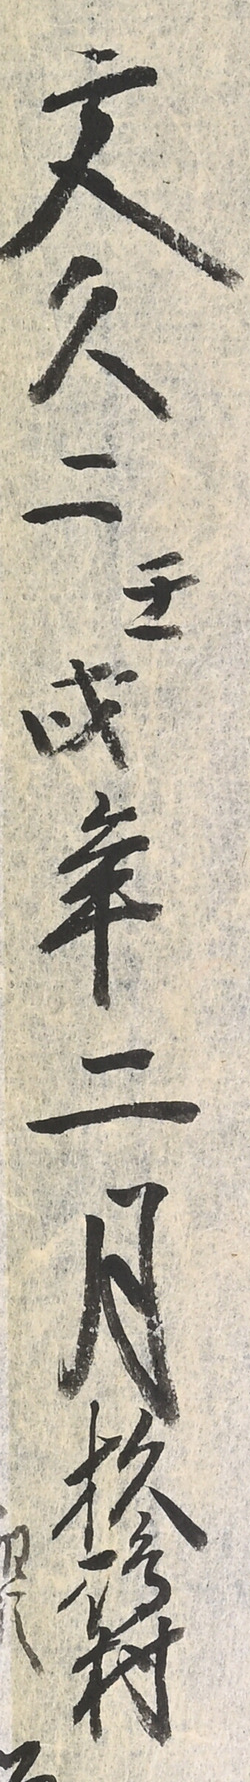文久二壬戌年二月杉島村
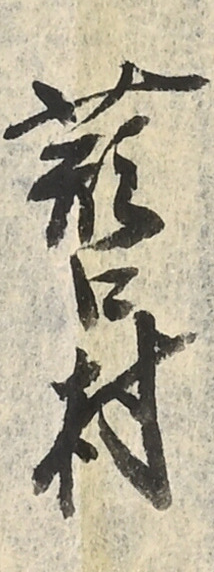荊口村
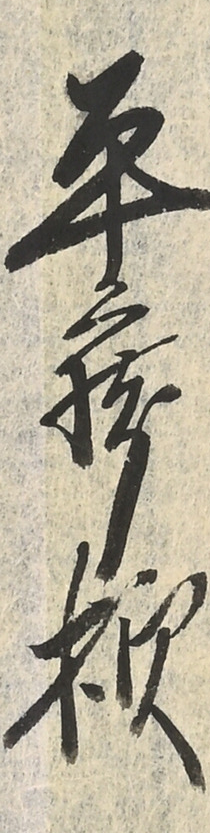平蔵様
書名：差上申一札之事
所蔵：伊那市立高遠町図書館・合同会社AMANE
